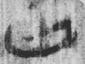㠯（以）
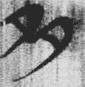多
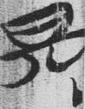○（期）
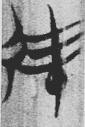隹
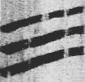三
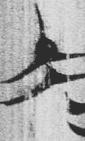大
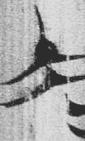夫
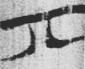亓（其）
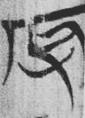辱
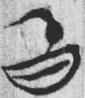昏（問）
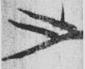之
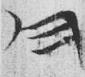今
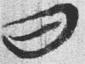日
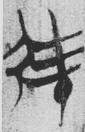隹（唯）
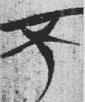不
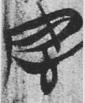悔
